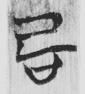{己口}
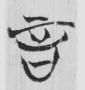言
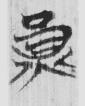員
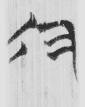今
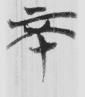不
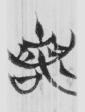若
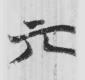亓
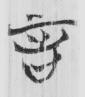言
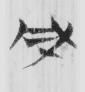凡
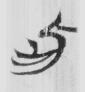此
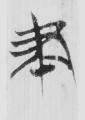聿
